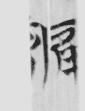{言雁}
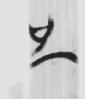也
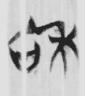和
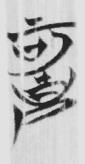{可克}
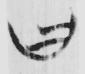曰
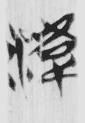湋
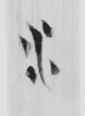水
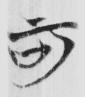可
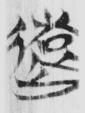遠
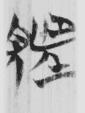{見望}
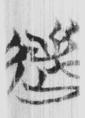逆
